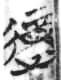○（復）
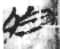於
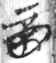梄（酉）
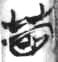○（怨）
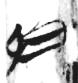於
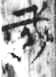戌
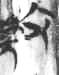○（媚）
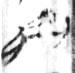於
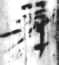亥
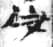凡
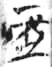城（成）
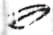日
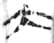大
